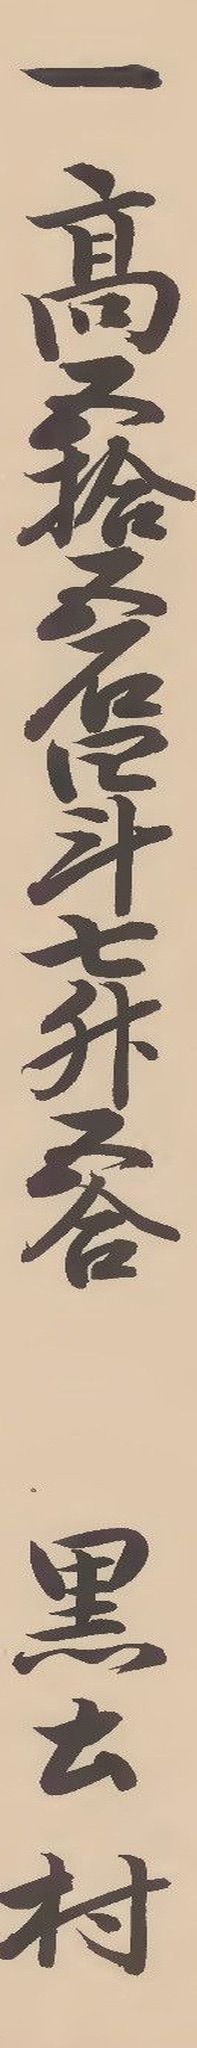一高五拾五石四斗七升五合黒土村
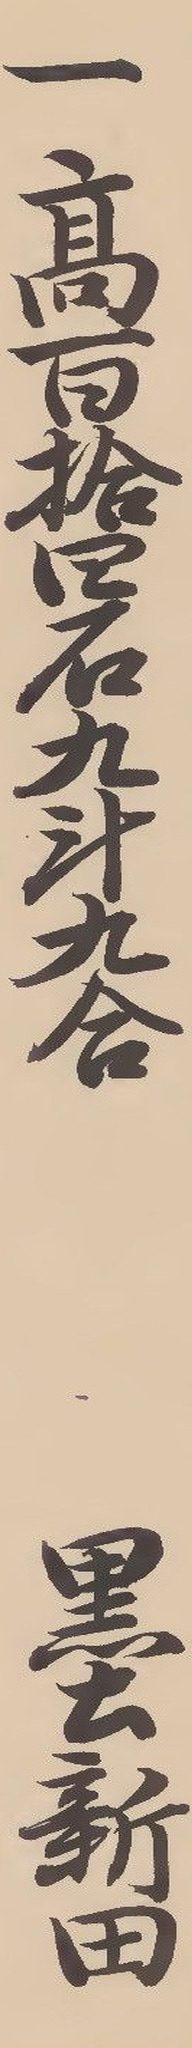一高百拾四石九斗九合黒土新田
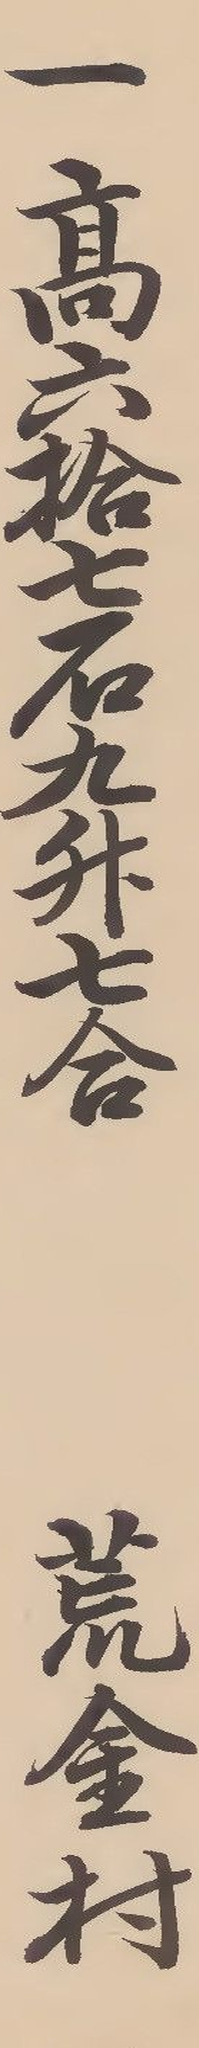一高六拾七石九升七合荒金村
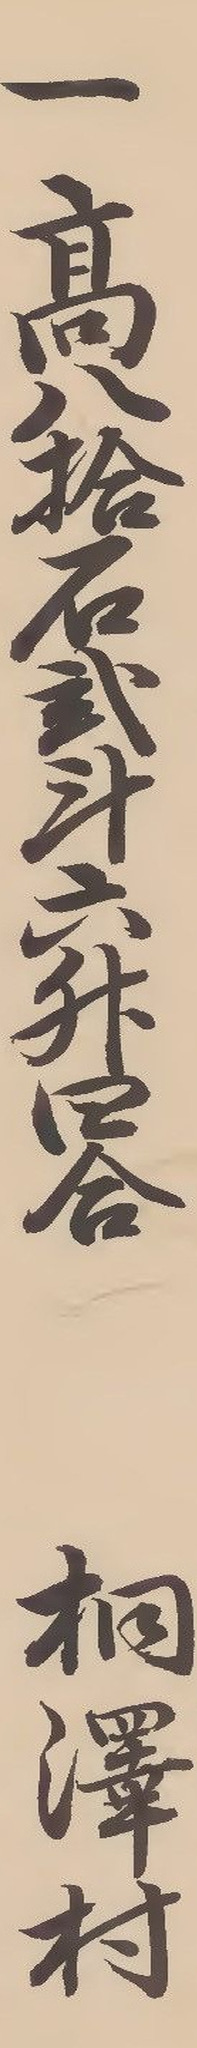一高八拾石弐斗六升四合桐沢村
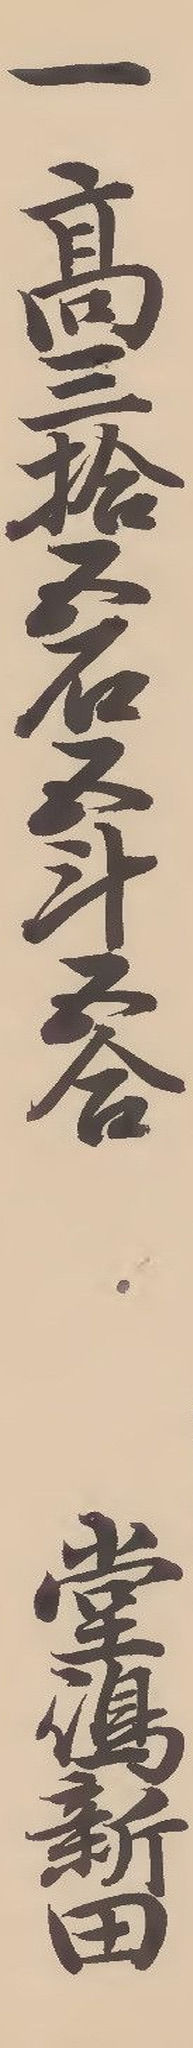一高三拾五石五斗五合堂島新田

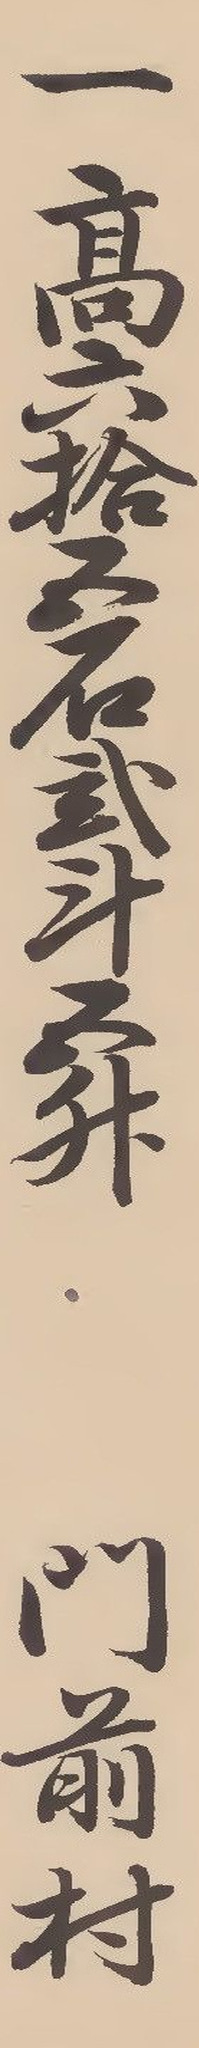一高六拾五石弐斗五升門前村
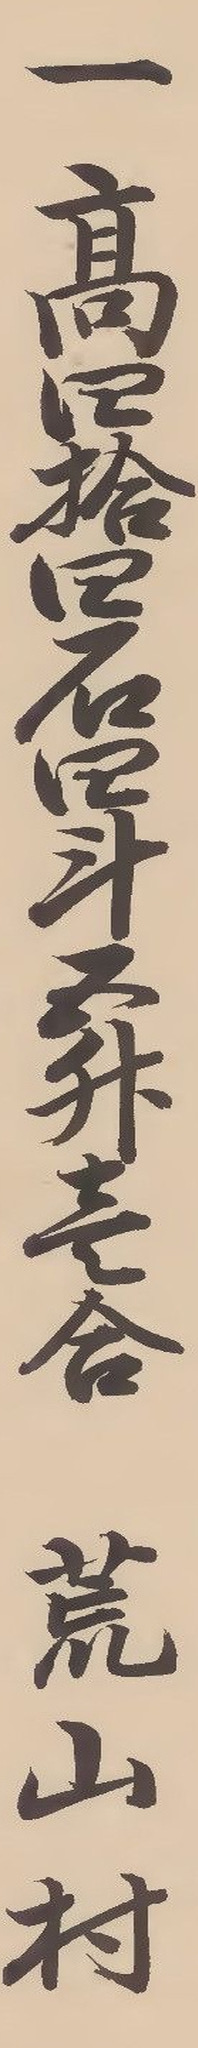一高四拾四石四斗五升壱合荒山村
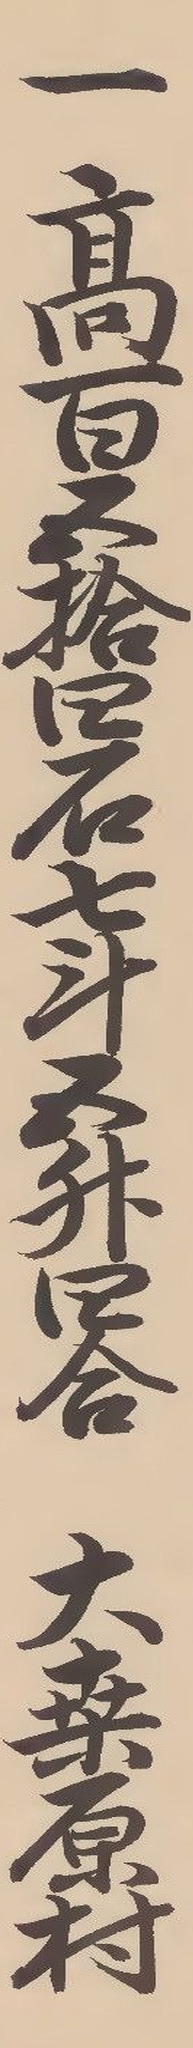一高百五拾四石七斗五升四合大桑原村
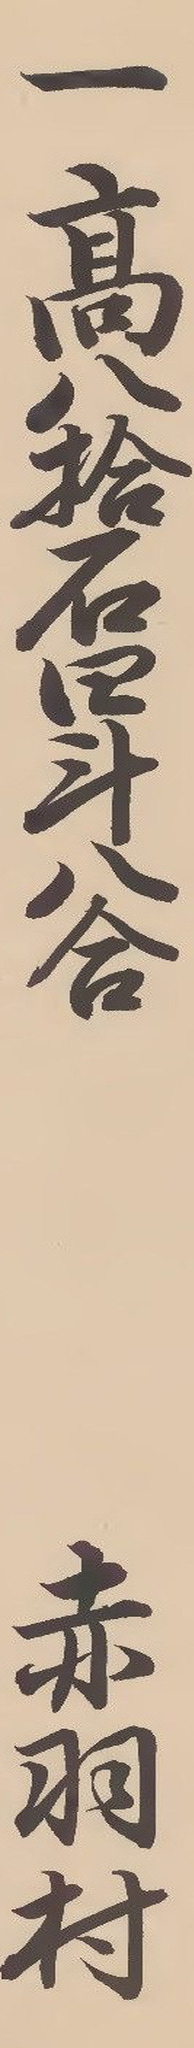一高八拾石四斗八合赤羽村
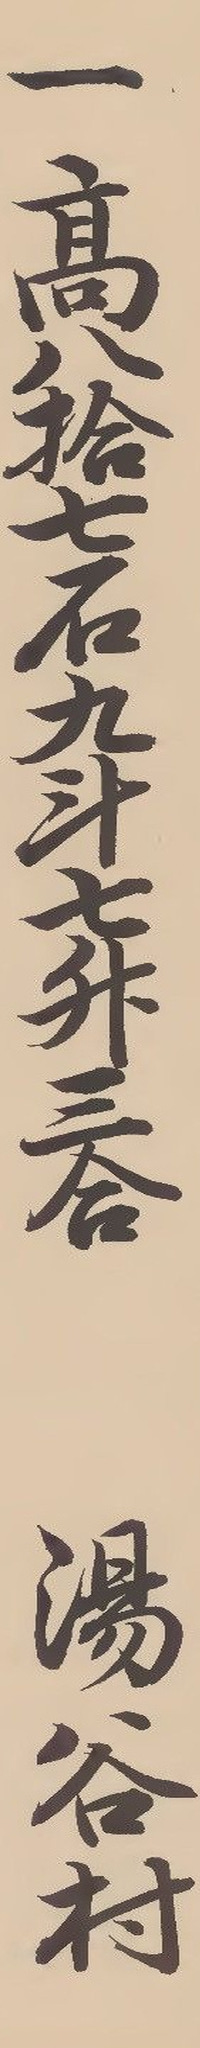一高八拾七石九斗七升三合湯谷村
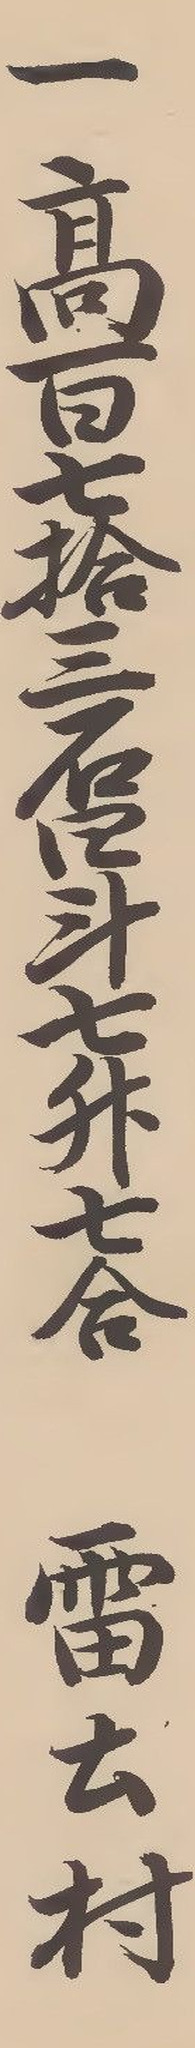一高百七拾三石四斗七升七合雷土村
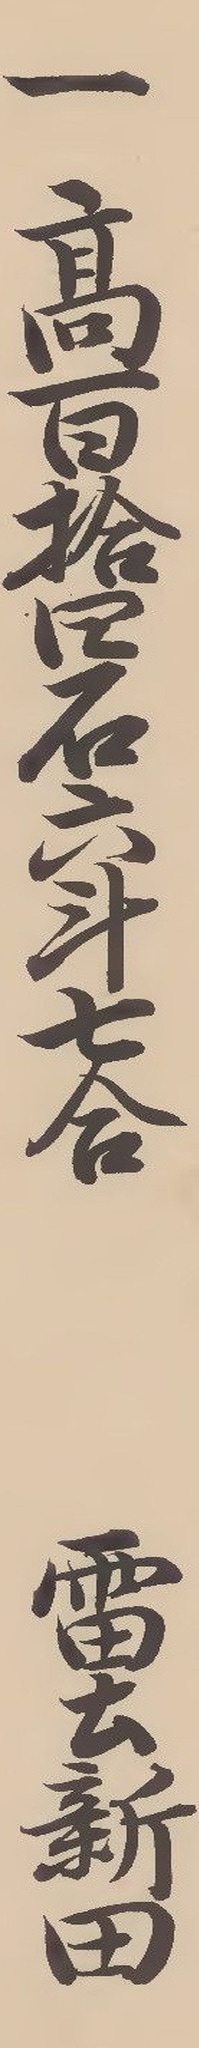一高百拾四石六斗七合雷土新田
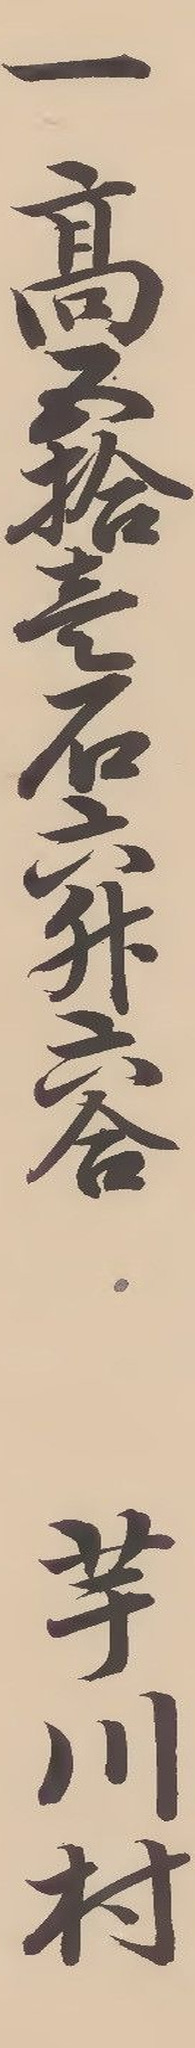一高五拾壱石六升六合芋川村

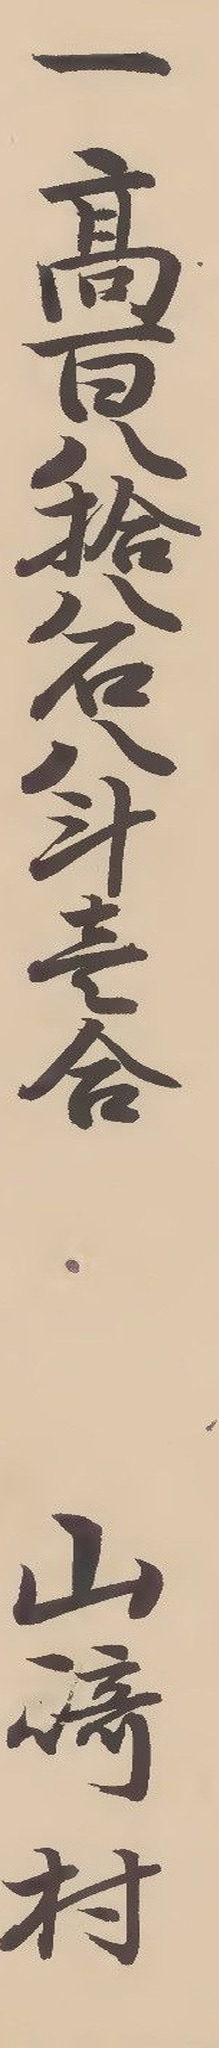一高百八拾八石八斗壱合山崎村
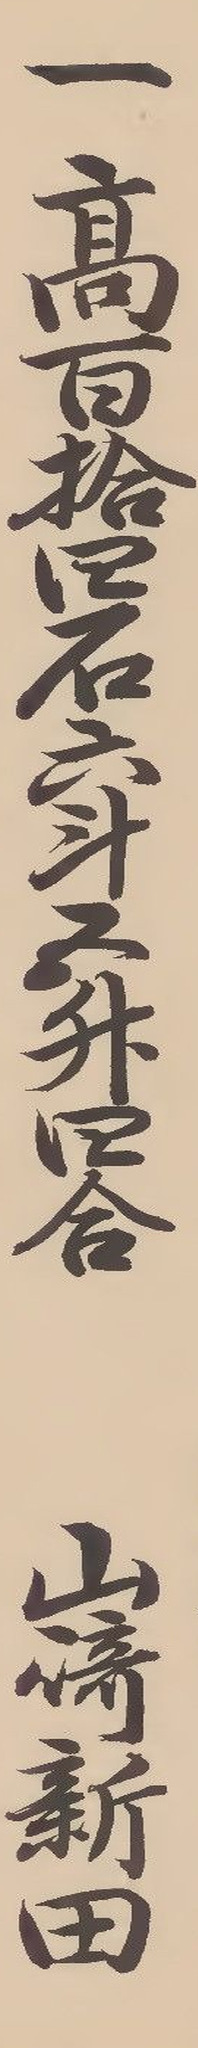一高百拾四石六斗五升四合山崎新田
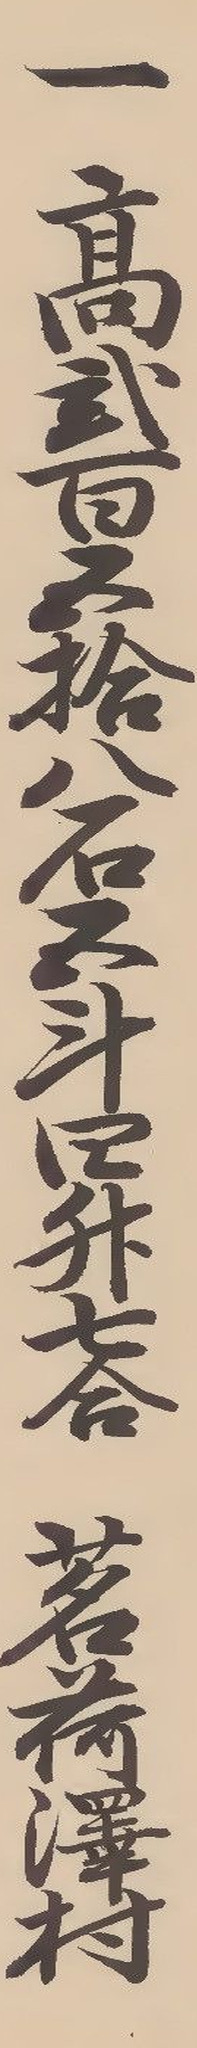一高弐百五拾八石五斗四升七合茗荷沢村
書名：越後国郷帳　中
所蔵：国立公文書館 National Archives of Japan
